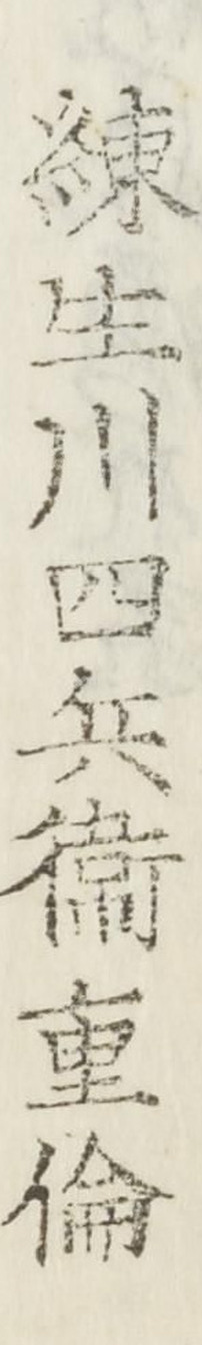い練生川四兵衛重倫
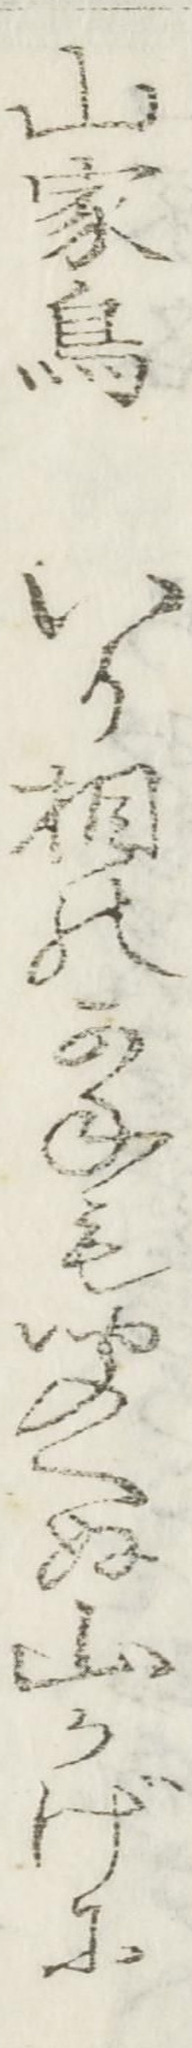山家鳥いり相のかねも聞へぬ山かげに
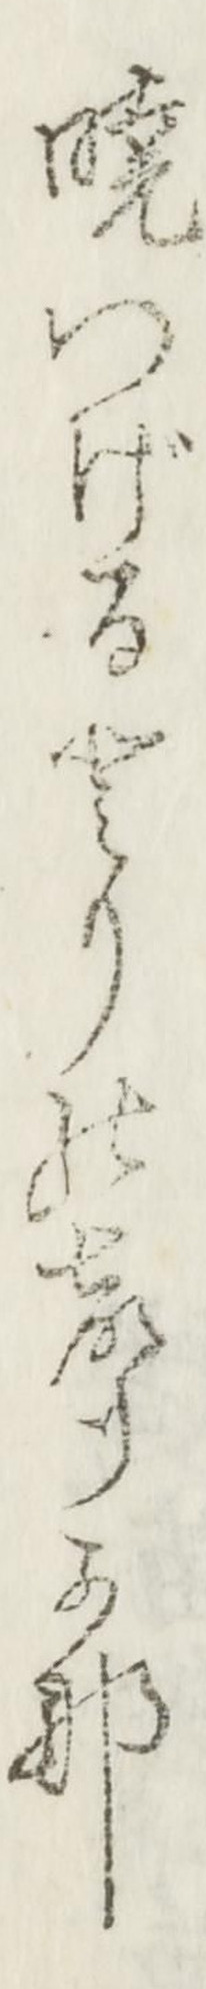暁つげるとりの聲かな
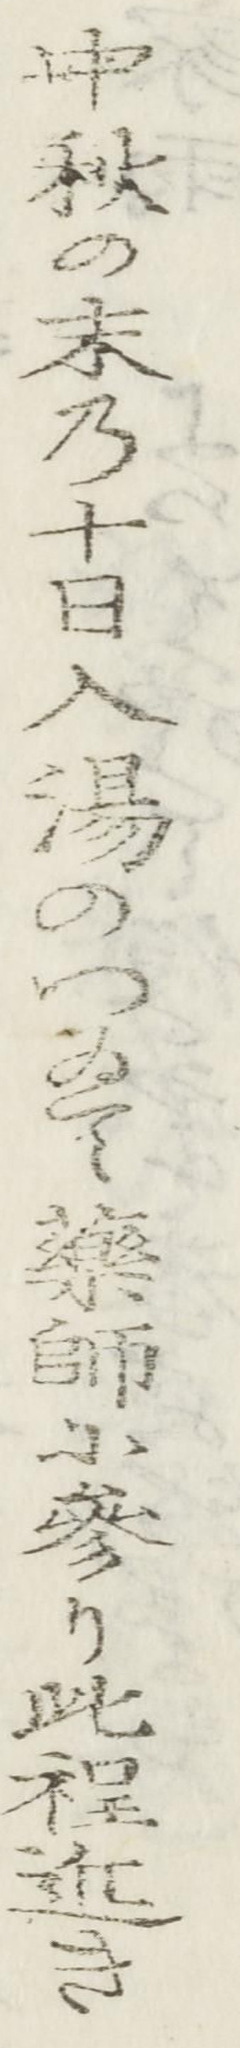中秋の末の十日入湯のつゐて薬師に参り此程近き
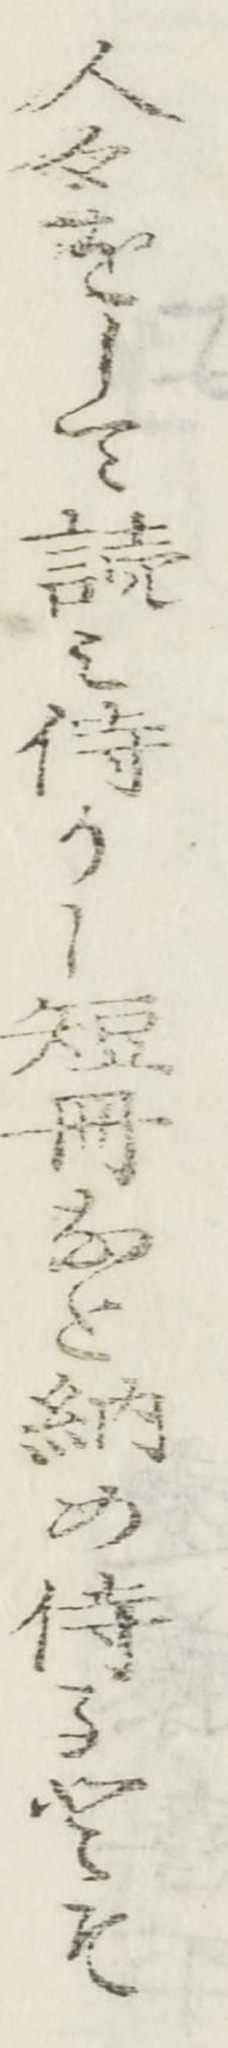人々をして読み侍りし短冊なと納め侍るとそ
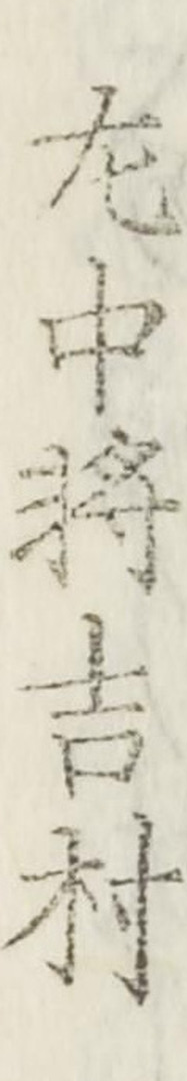左中将吉村
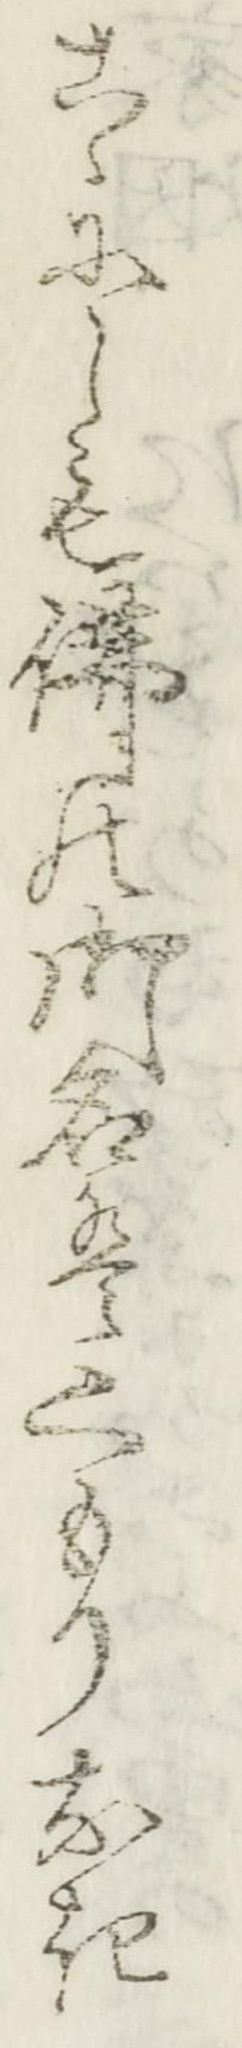こゝにしも仏の御名はくもりなき
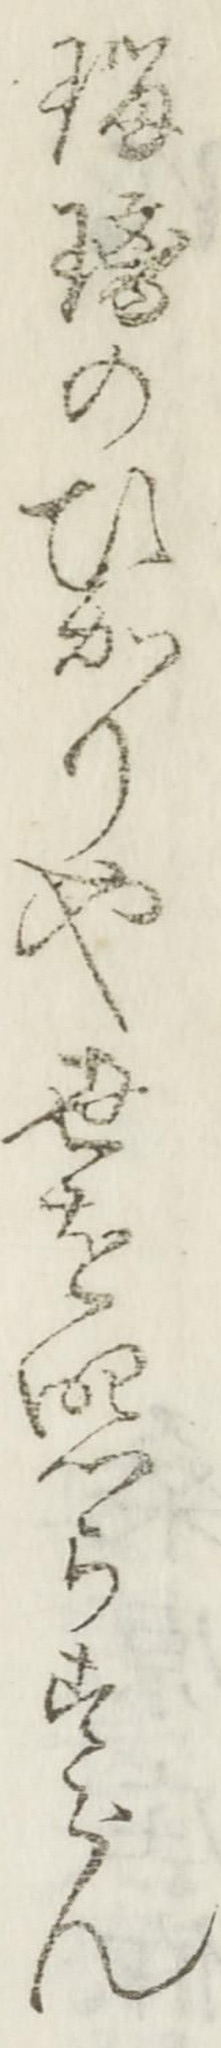瑠璃のひかりや世を照らすらん
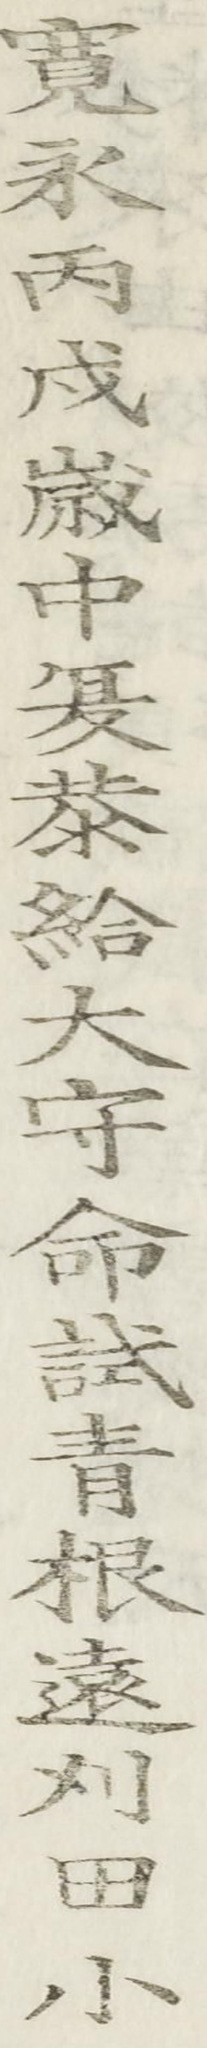寛永丙戍歳中夏恭給大守命試青根遠刈田小
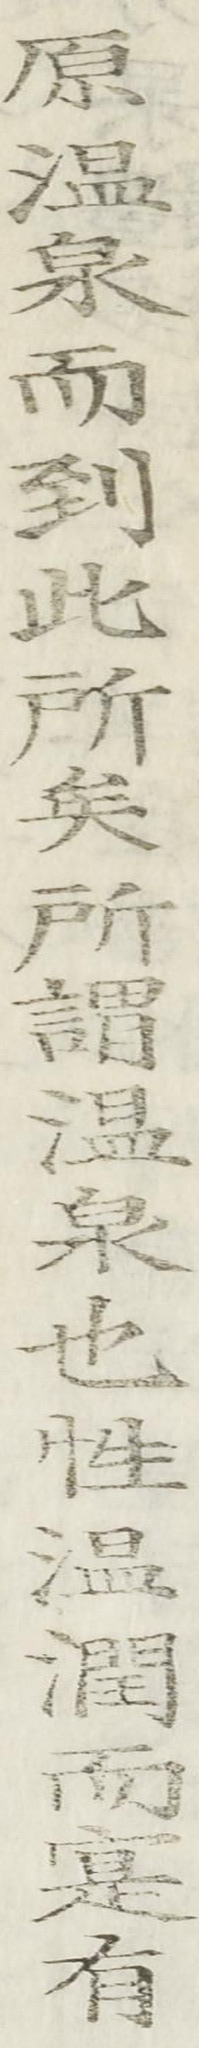原温泉而到此所矣所謂温泉也性温潤而寔有
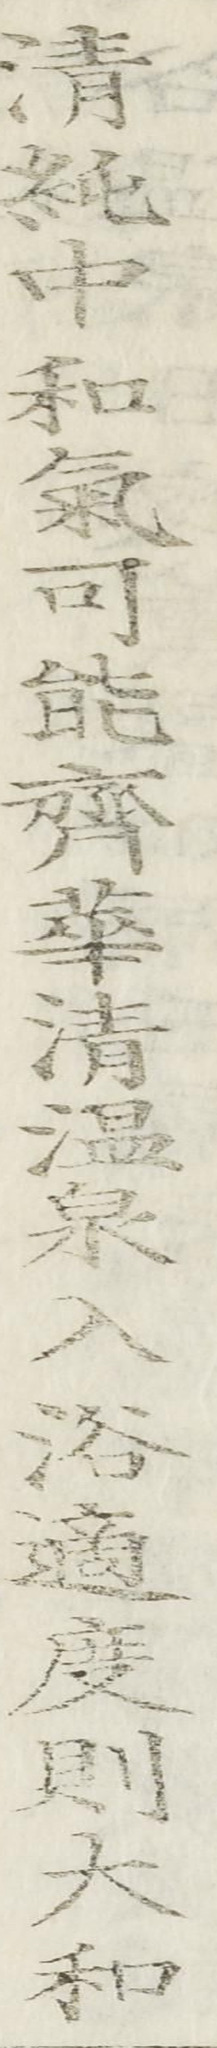清純中和気可能斉華清温泉入浴適度則大和
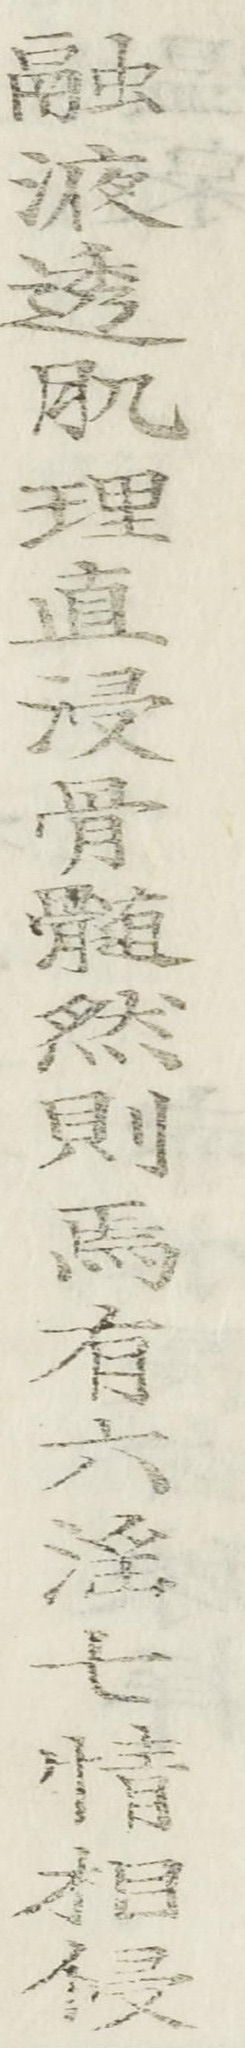融液透肌理直浸骨髄然則焉有六淫七情相侵
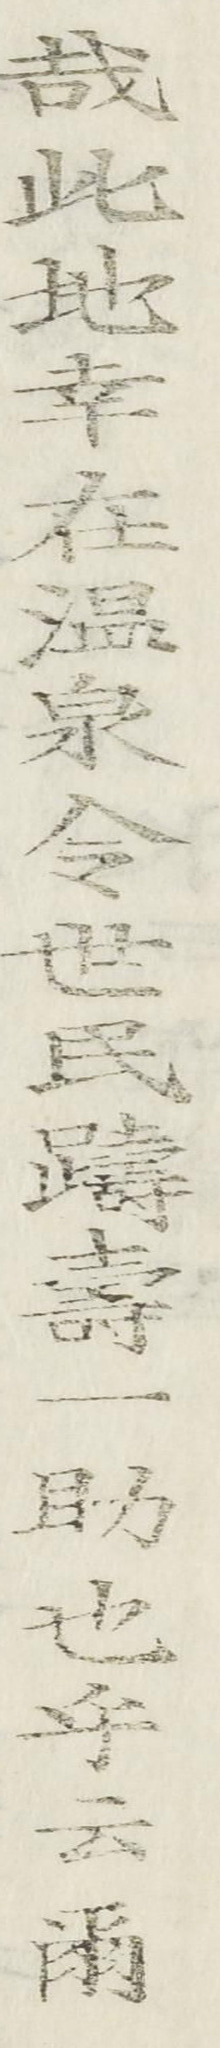哉此地幸在温泉令世民躊寿一助也乎云爾
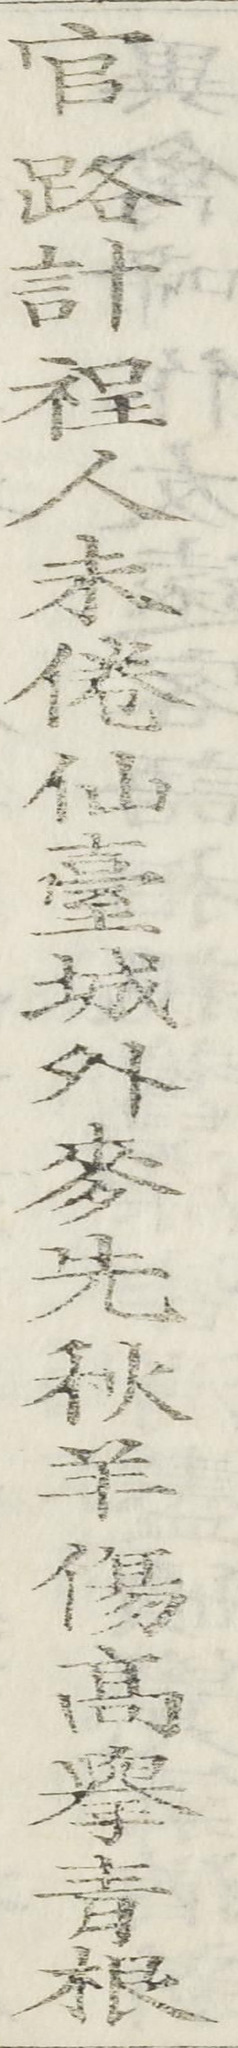官路計程人未倦仙台城外麦先秋羊傷高挙青根
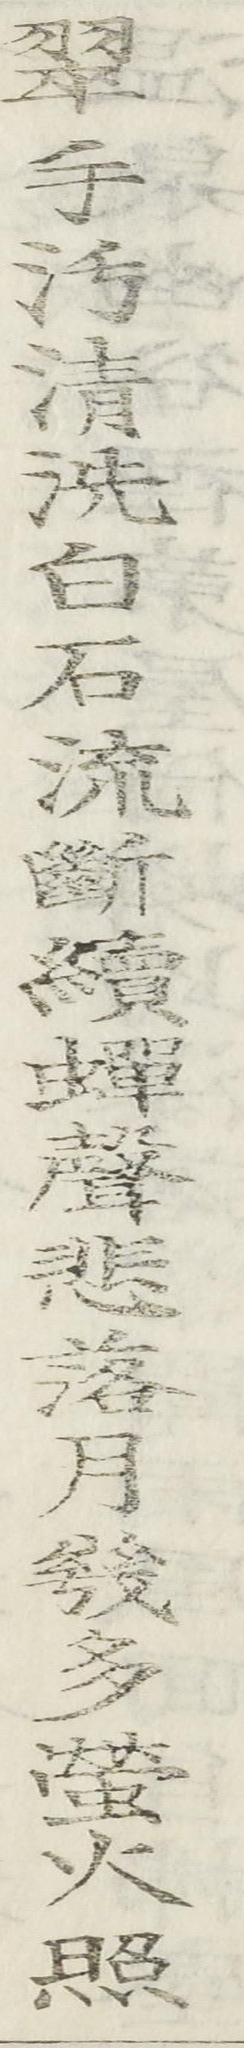翠乎汚清洗白石流断続蟬声悲落月幾多蛍火照
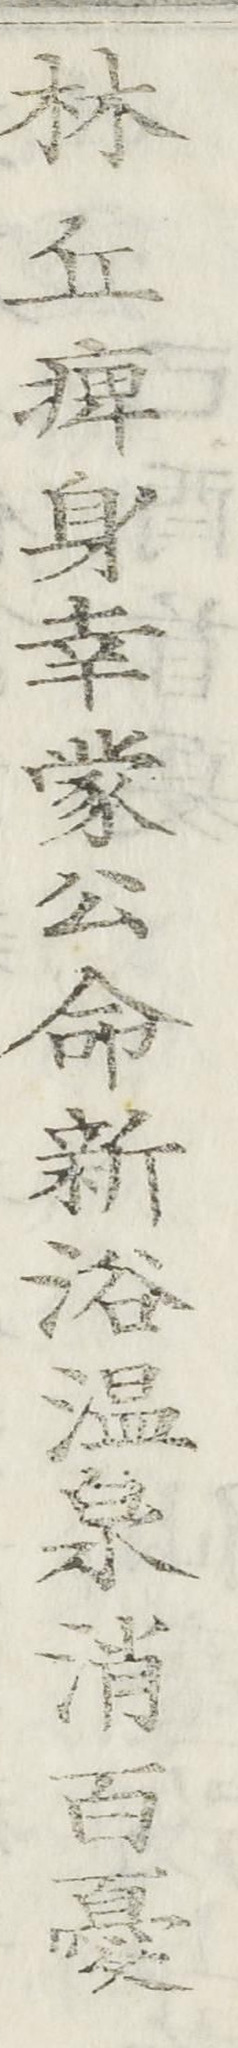林丘痺身幸蒙公命新浴温泉消百憂
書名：鎌先温泉由來記
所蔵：東京大学地震研究所図書室 Earthquake Research Institute Library, The University of Tokyo, JAPAN
